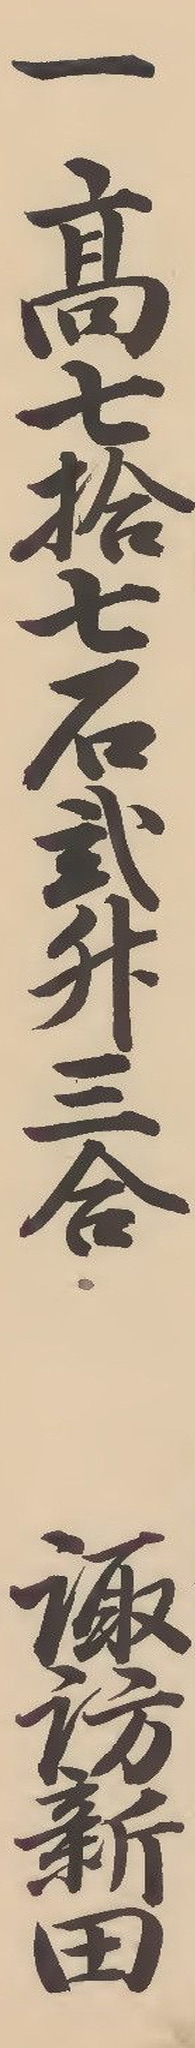一高七拾七石弐升三合諏訪新田

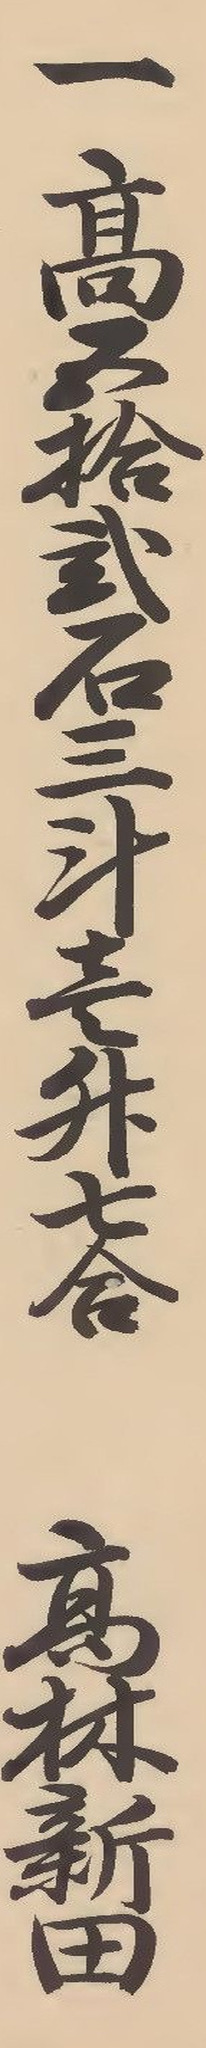一高五拾弐石三斗壱升七合高林新田
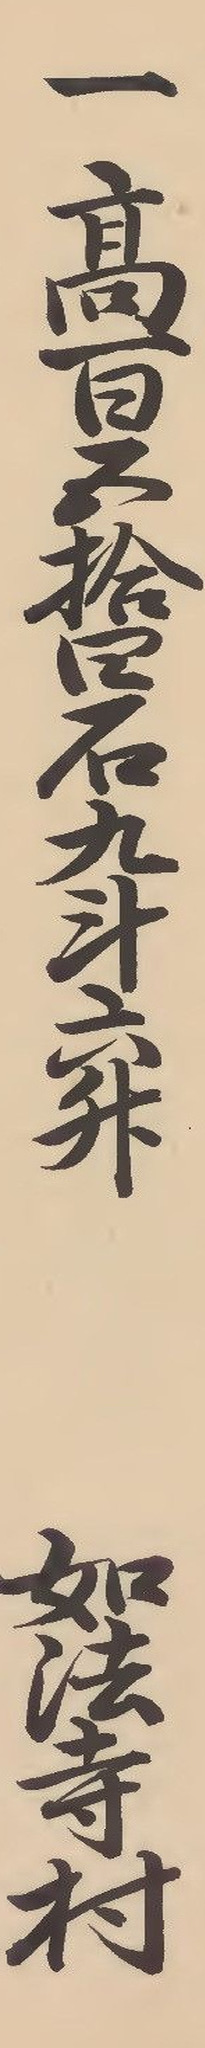一高百五拾四石九斗六升如法寺村
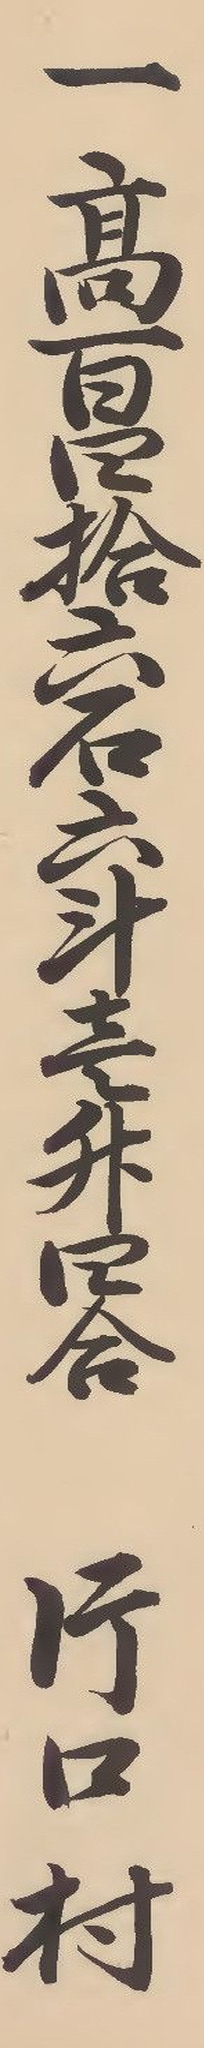一高百四拾六石六斗壱升四合片口村
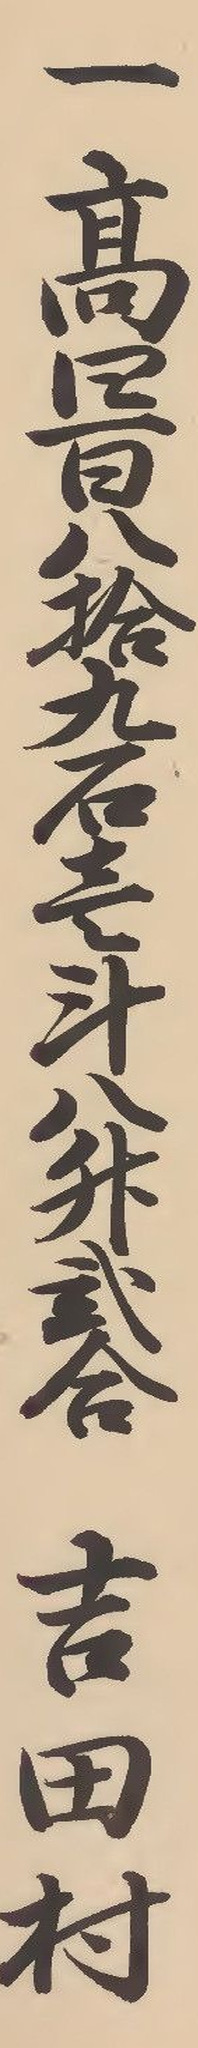一高四百八拾九石壱斗八升弐合吉田村
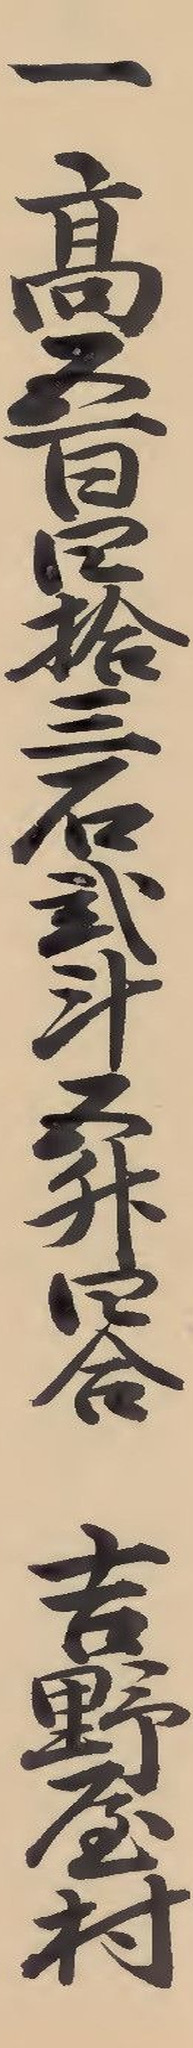一高五百四拾三石弐斗五升四合吉野屋村
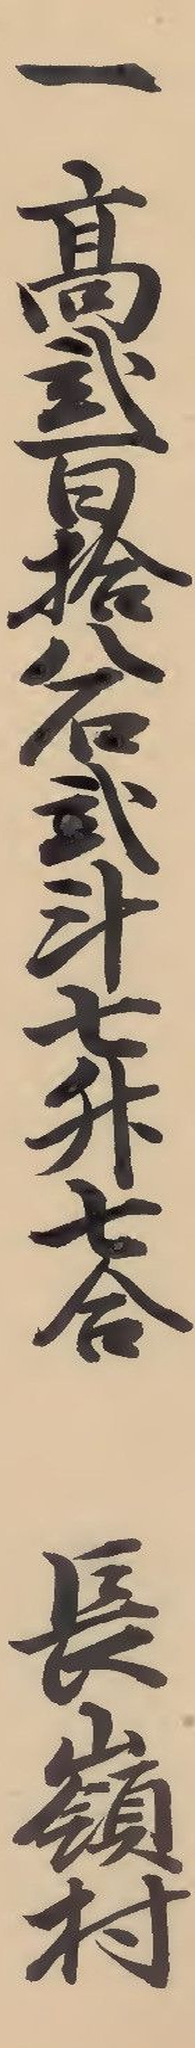一高弐百拾八石弐斗七升七合長嶺村
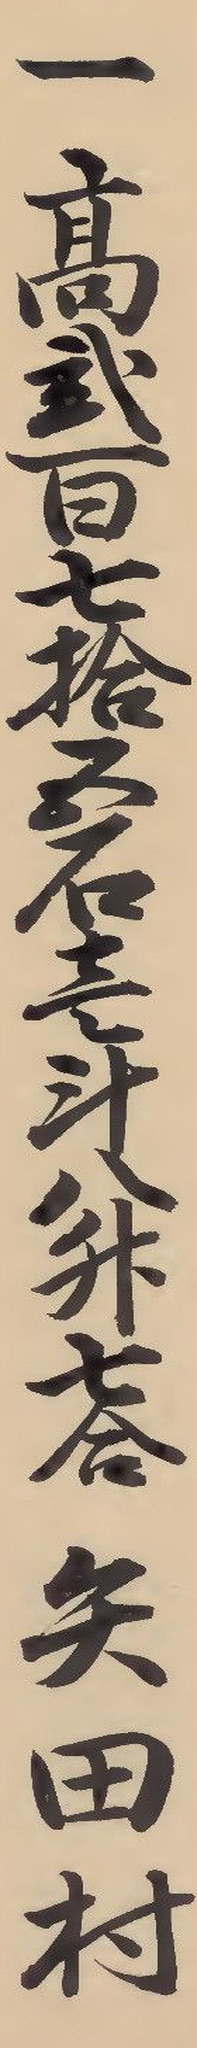一高弐百七拾五石壱斗八升七合矢田村
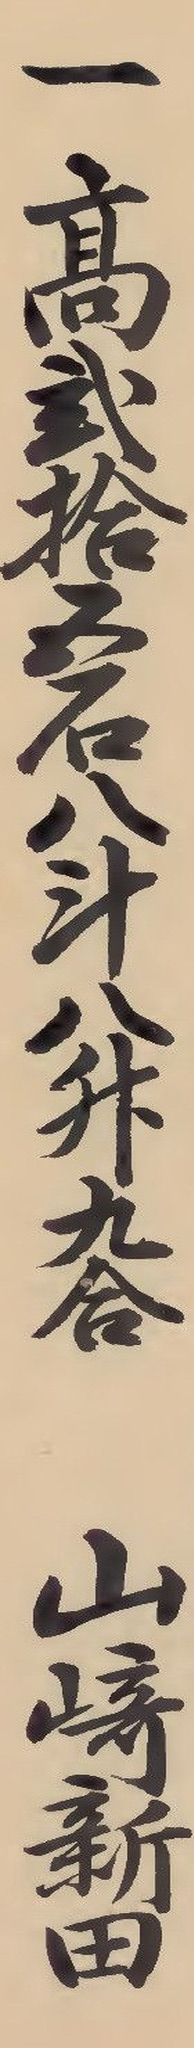一高弐拾五石八斗八升九合山崎新田

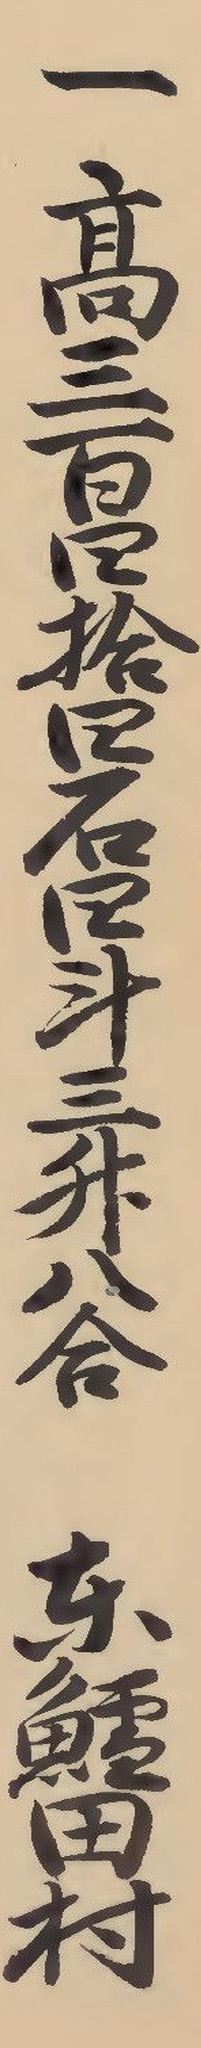一高三百四拾四石四斗三升八合東鱈田村
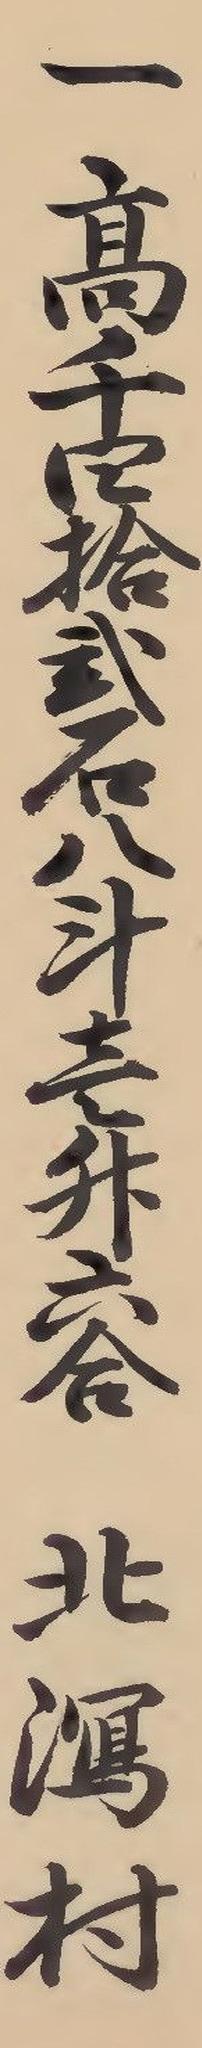一高千四拾弐石八斗壱升六合北潟村
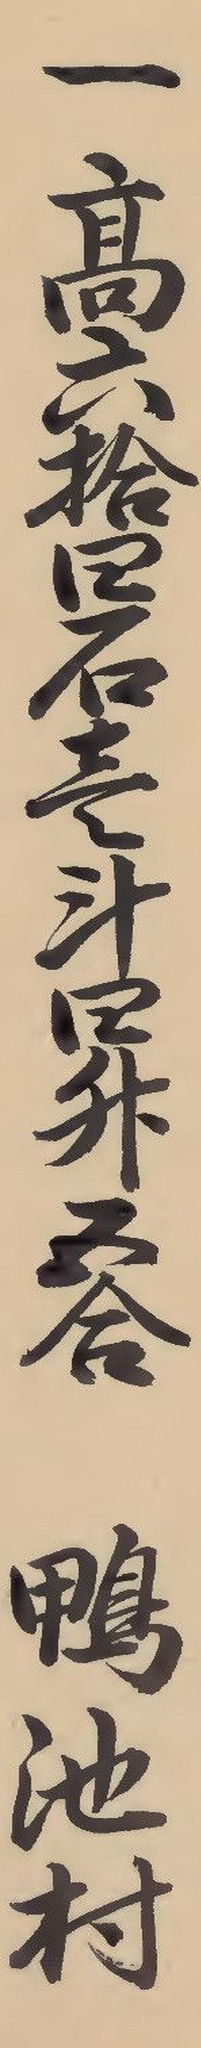一高六拾四石壱斗四升五合鴨池村
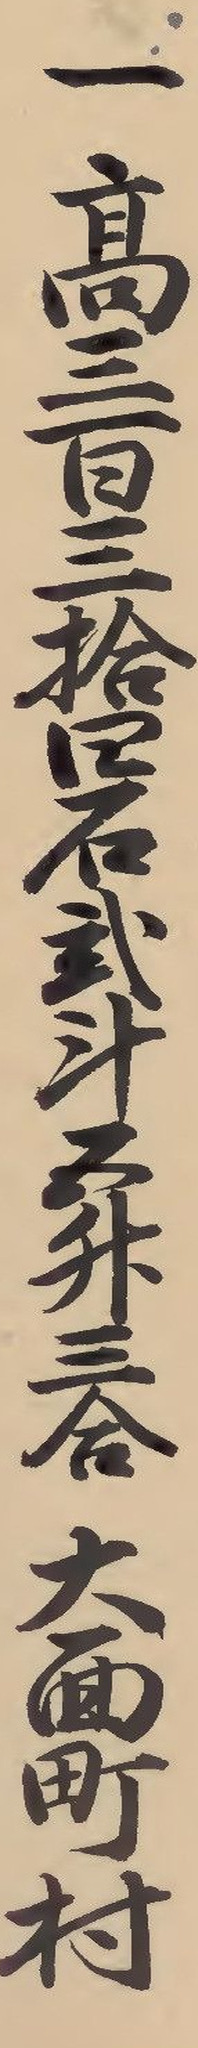一高三百三拾四石弐斗五升三合大面町村
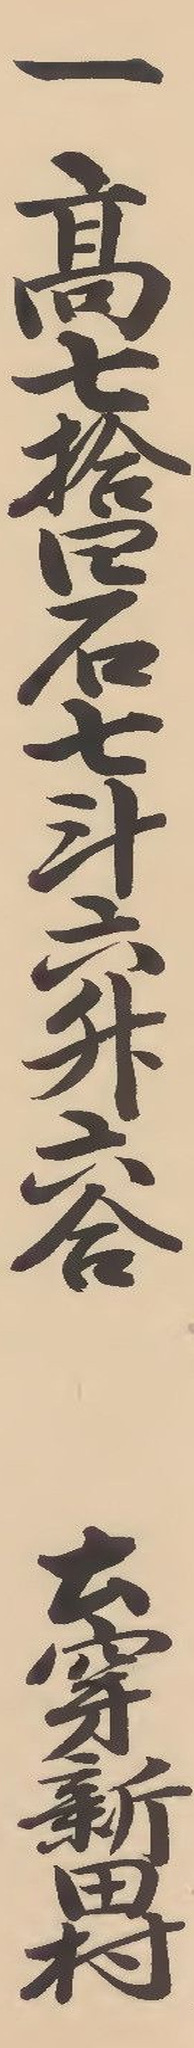一高七拾四石七斗六升六合土穿新田村
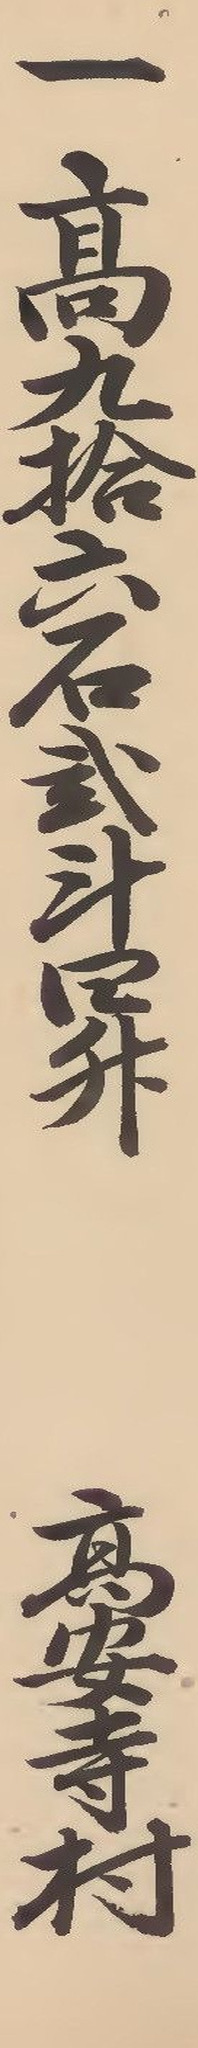一高九拾六石弐斗四升高安寺村
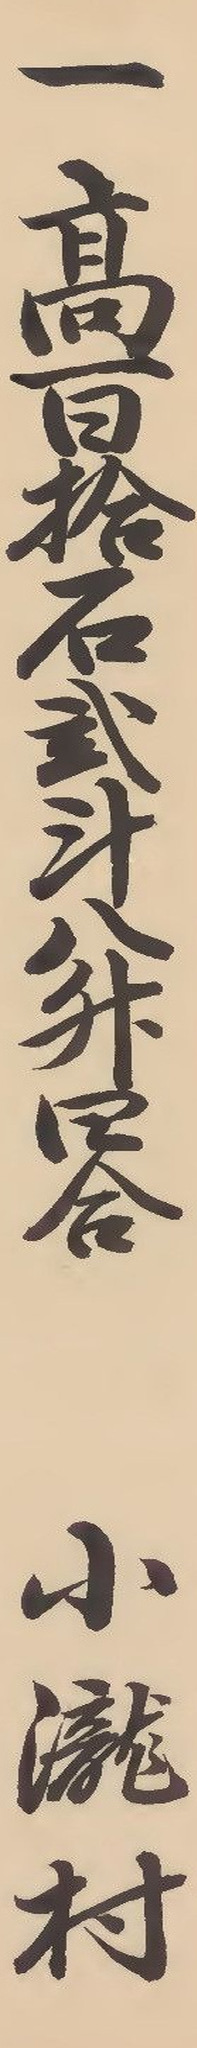一高百拾石弐斗八升四合小滝村
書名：越後国郷帳　下
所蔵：国立公文書館 National Archives of Japan
